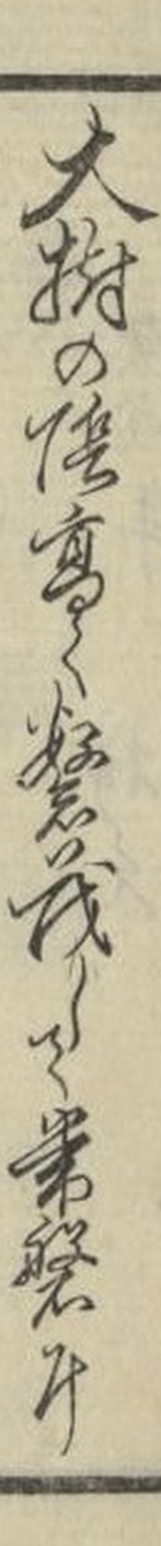大樹の陰高く繁茂して常磐に
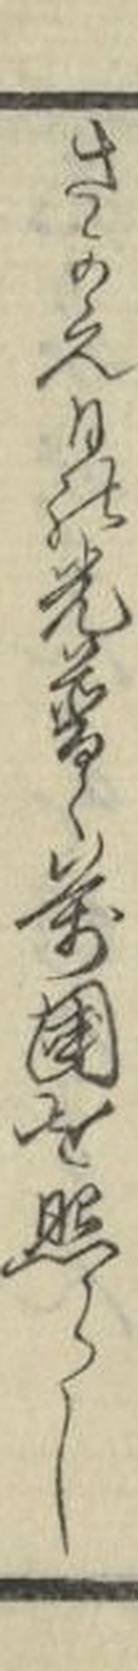さかえ日の光普く万国を照らし
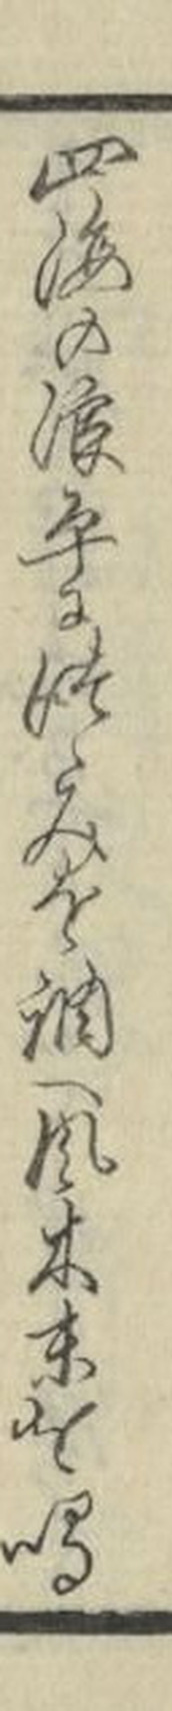四海の浪平につゝみを調へ風木末を鳴
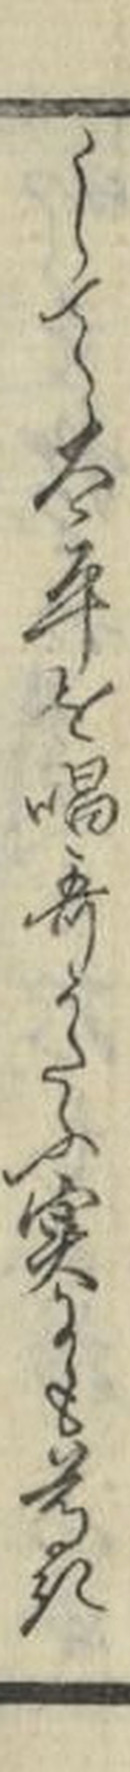して太平を唱哥うたふ実にも尊き
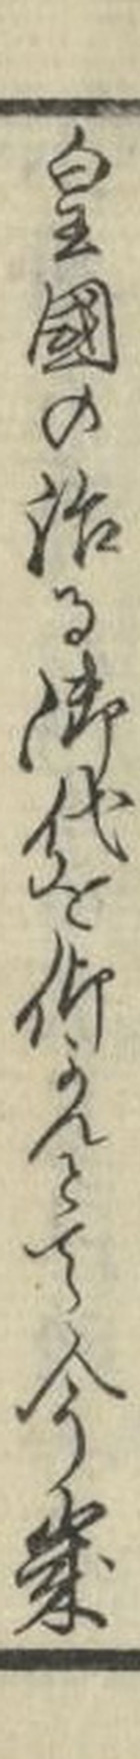皇国の治る御代を仰かんとて今歳
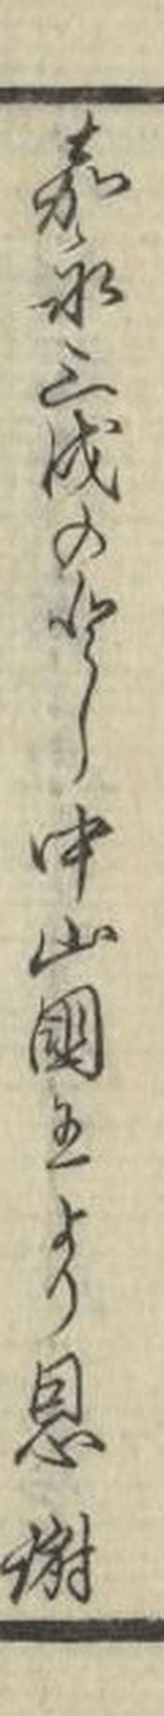嘉永三戌のとし中山国王より恩謝
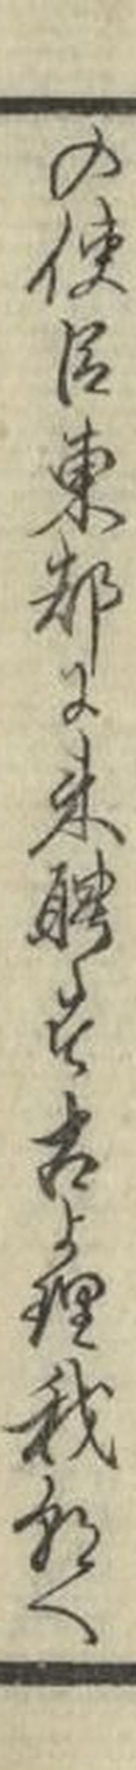の使臣東都に来聘す古より我朝へ
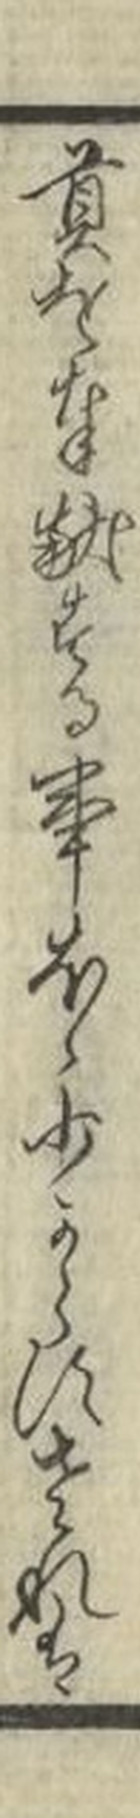貢を奉献する事ほゝ少からすされは
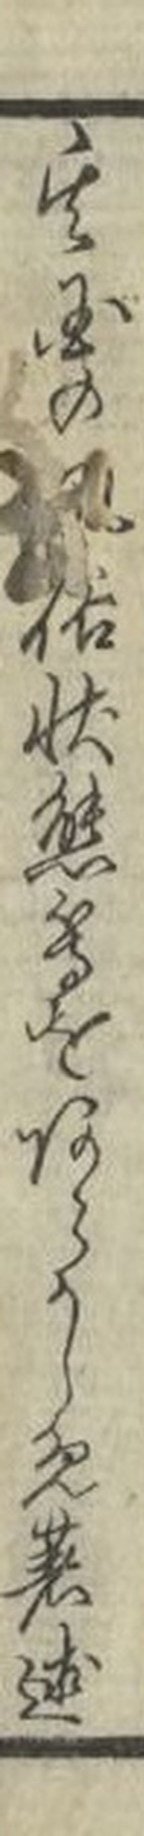其国の俗状態等をあらかしめ著述
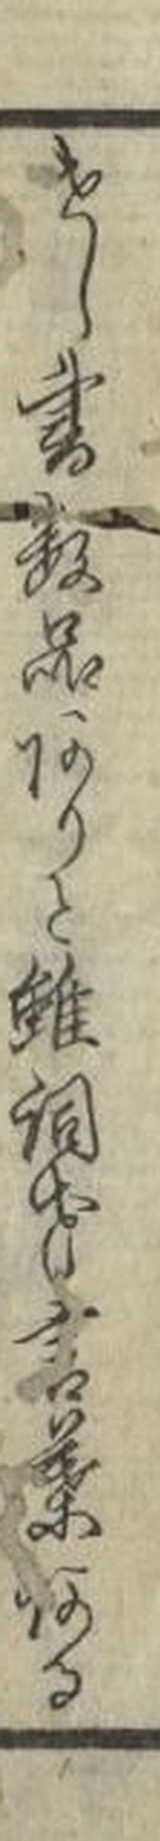せし書数品ありと雖詞花言葉ある

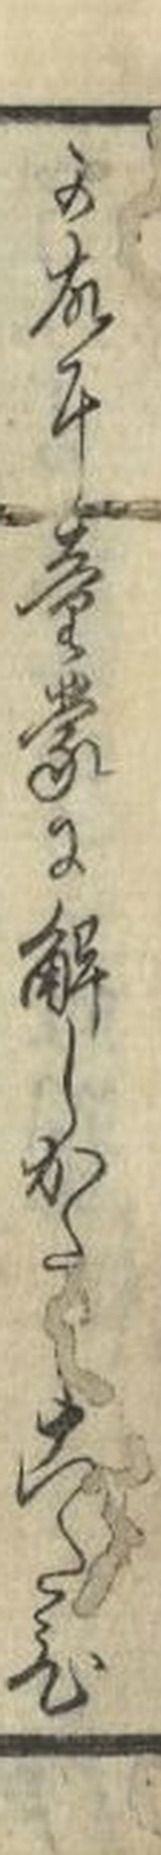か故に童蒙に解しかたこたひ
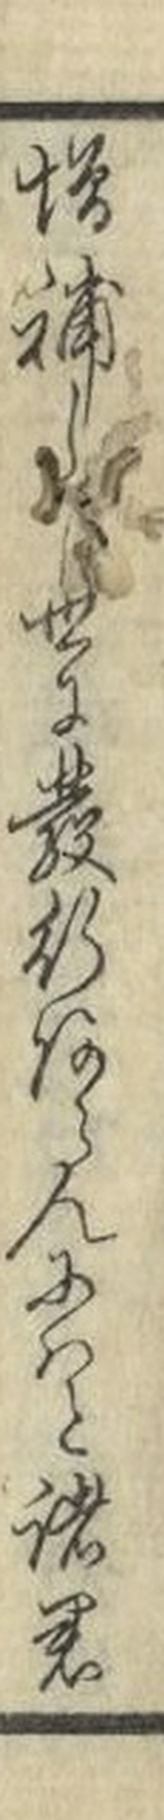増補し世に発行あらんにはと諸君
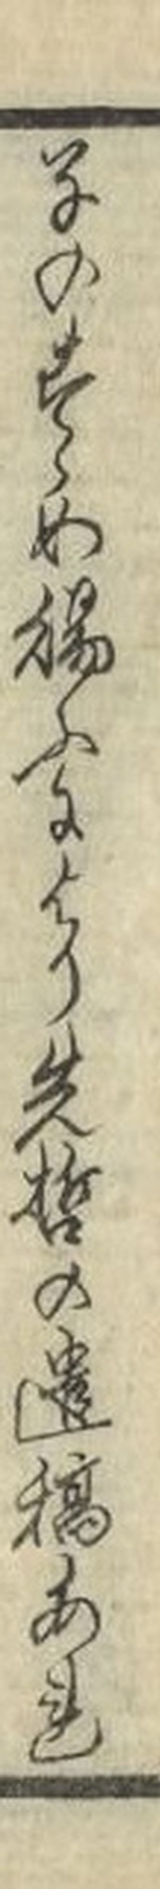子のすゝめ賜ふにより先哲の遺稿あれ
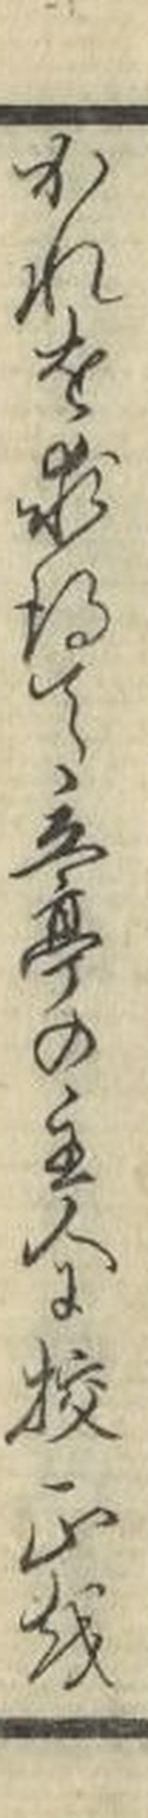かれを求得て立亭の主人に挍正を
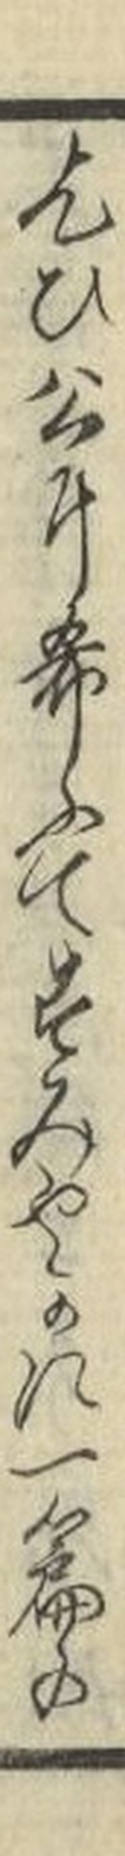乞ひ公に希ふてすみやかに一篇の
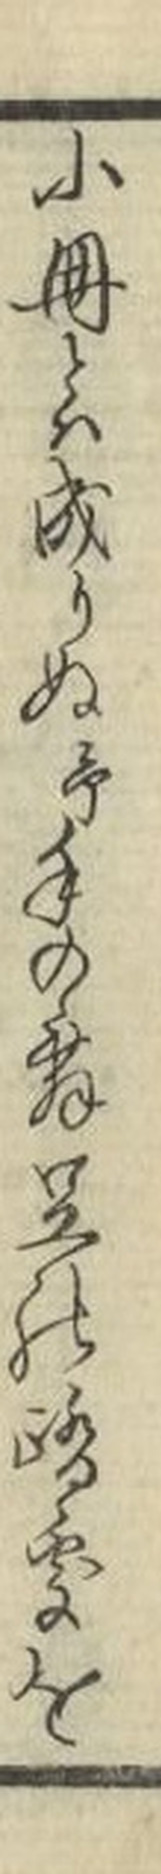小冊とは成りぬ予手の舞足の踏処を
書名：琉球解語
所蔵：University of the Ryukyus Library
